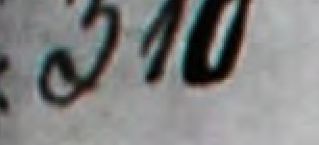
310
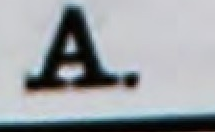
A.
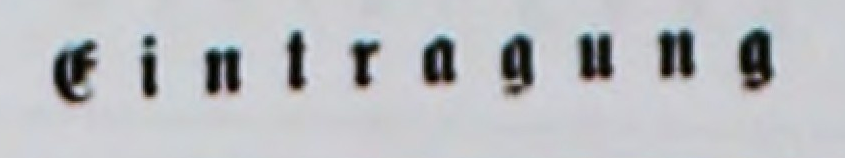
Eintragung
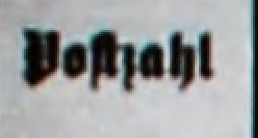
Postzahl
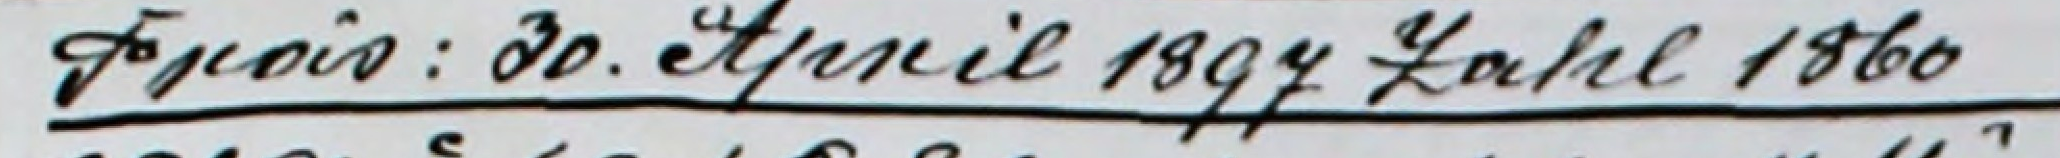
Präs: 30. April 1897 Zahl 1860
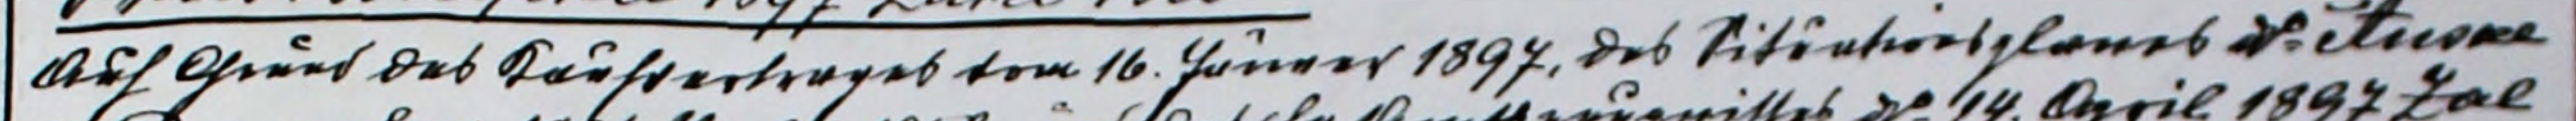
Aug Grund des Kaufvertrages vom 16. Jänner 1897, des Situationsplanes ddo Aussee
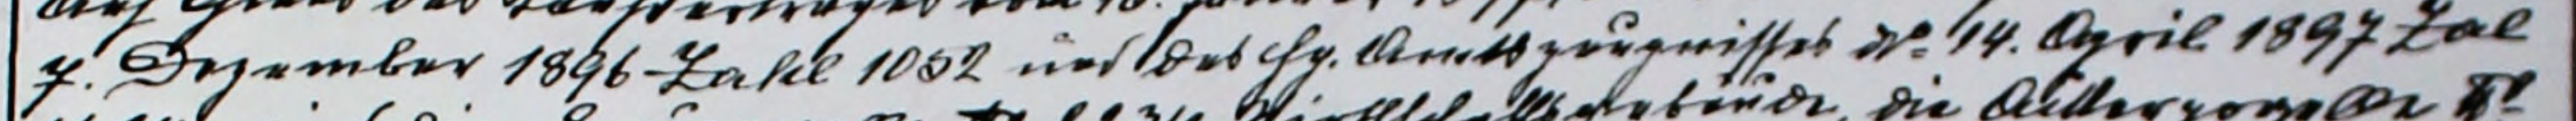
7. Dezember 1896 Zahl 1052 und des hg. Amtszeugnisse ddo 14. April 1897 Zal
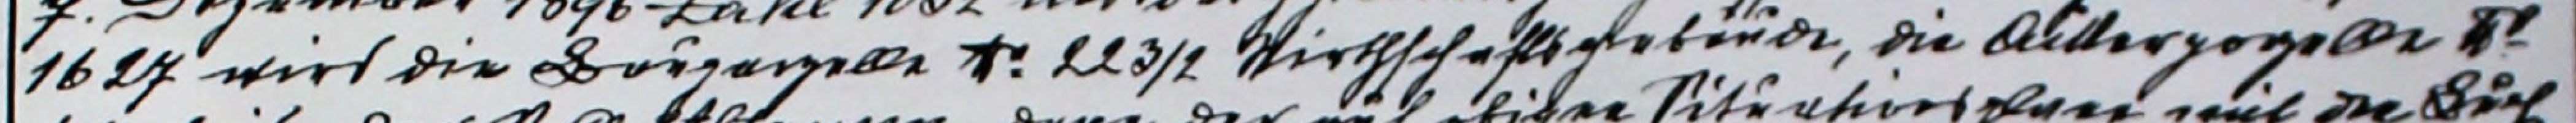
1627 wird die Bauparzelle No 223/2 Wirthschaftsgebäude, die Outterparzelle No
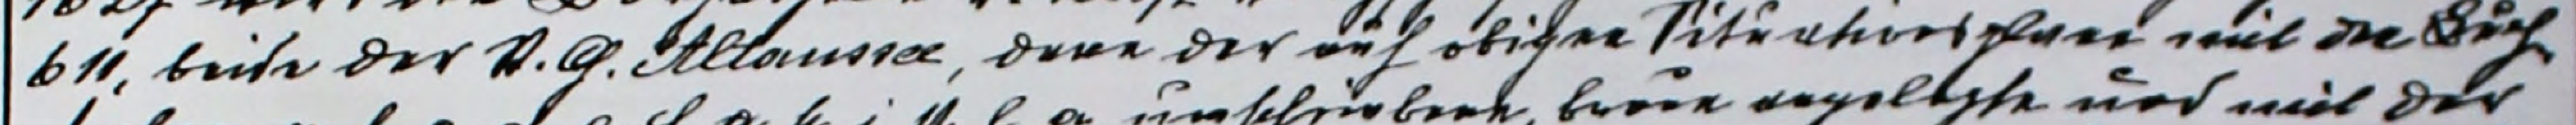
611, beide der St.G. Altaussee, deren der auf obiger Situationsplane mit den Buch
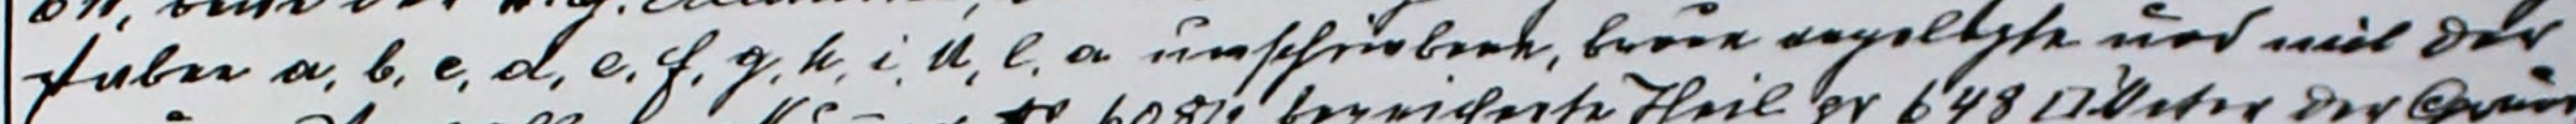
haben a, b, e, d, e, f, g, h, i, k, l, a umschriebene, Brunn angelegte und mit der
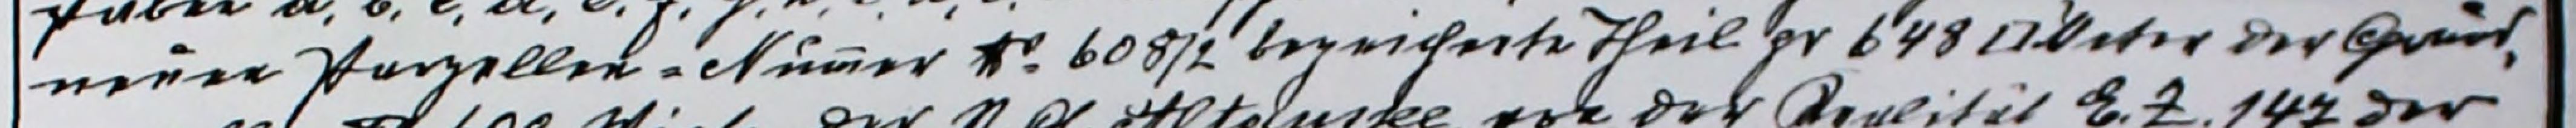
neuen Parzellen - Nummer No 608/2 bezeichnete Theil pr 648 Öketer der Grund„
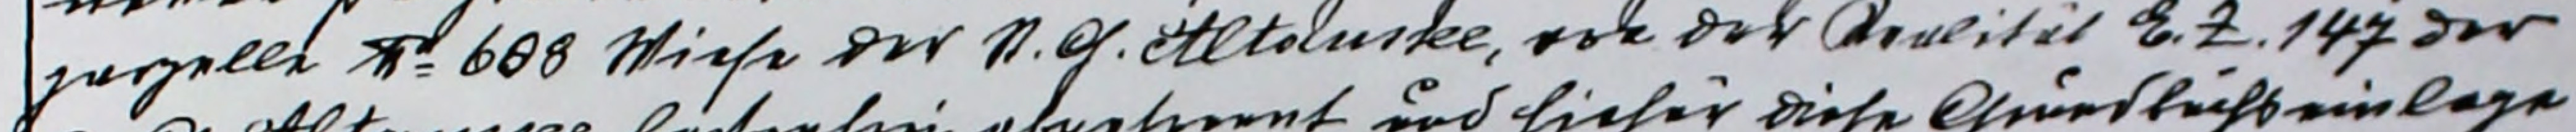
parzelle No 608 Wiese der St.G. Altaussee, von der Realität E.Z. 147 der
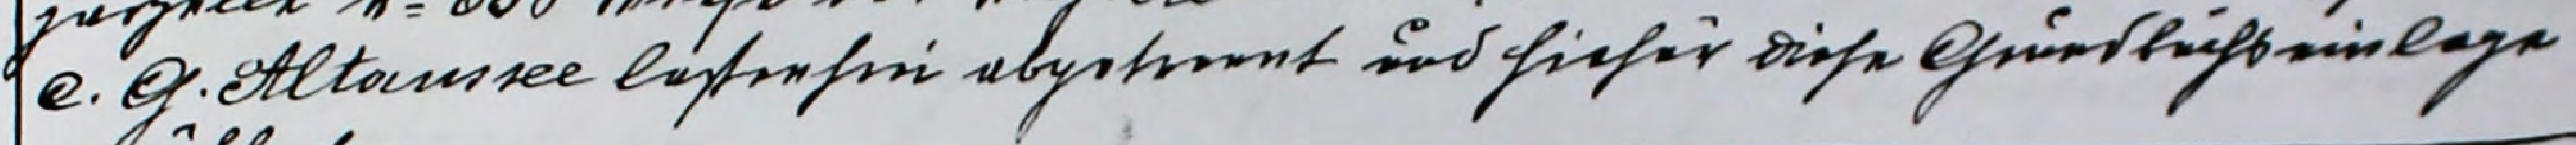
C.G. Altaussee lastenhin abgetrennt und hiefür diese Grundbuchseinlage
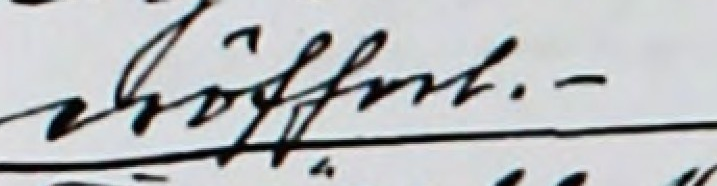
eröffnet.-
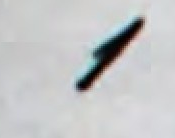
1
